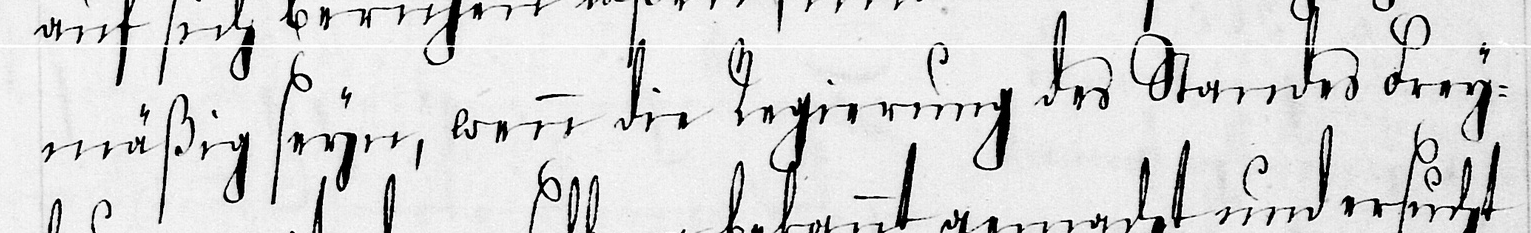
mäßig seyn, wenn die Regierung des Standes Frey¬
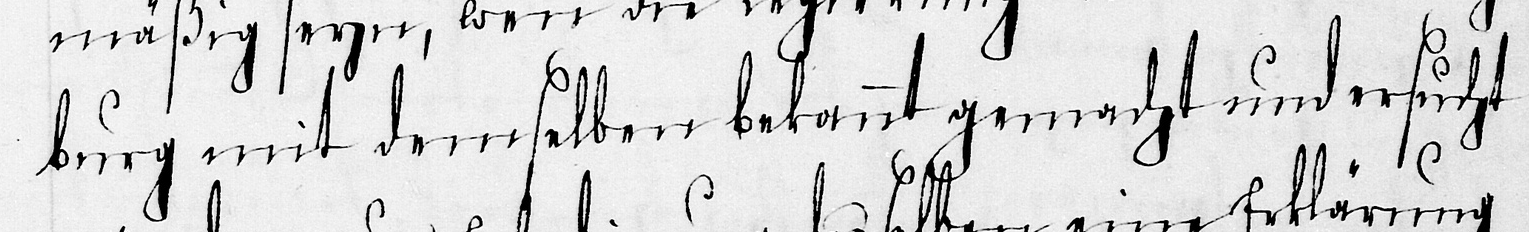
burg mit demselben bekannt gemacht und ersucht
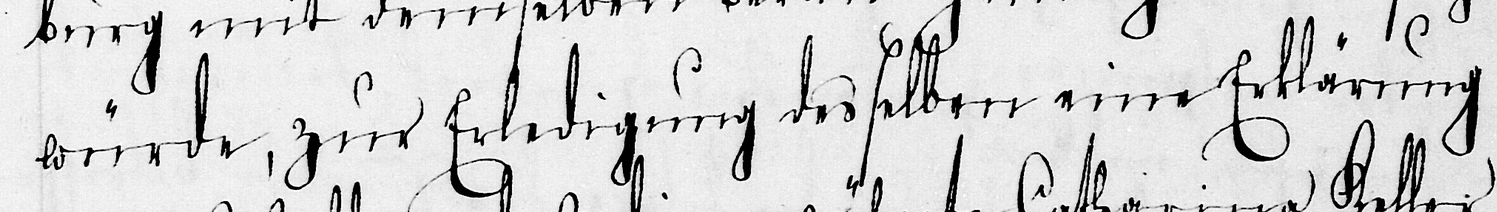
würde, zur Erledigung desselben eine Erklärung
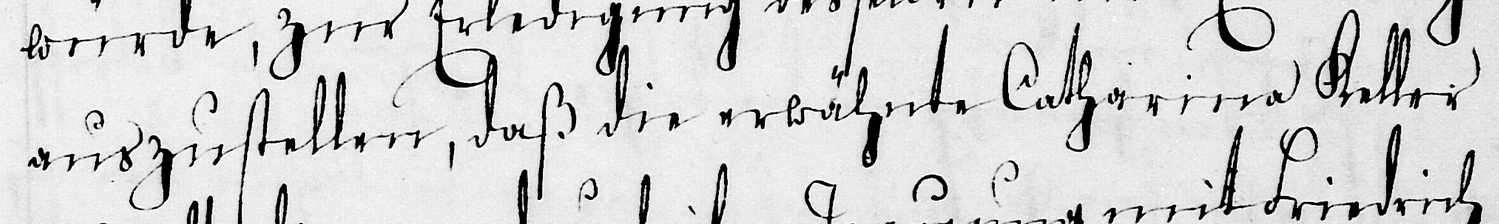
auszustellen, daß die erwähnte Catharina Keller
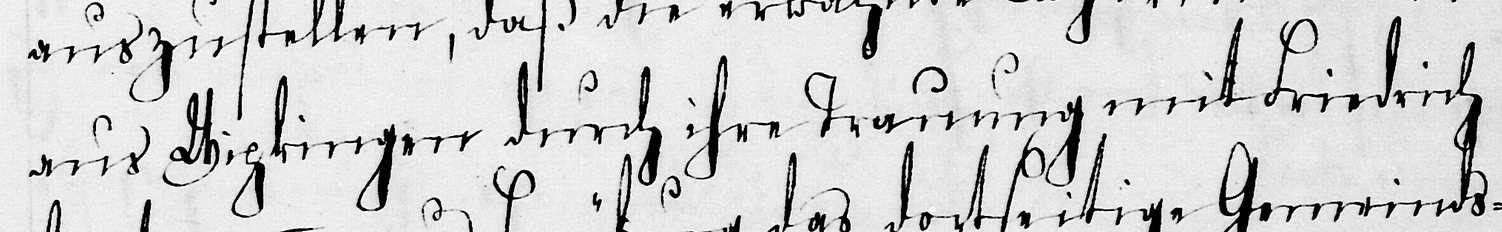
aus Wipkingen durch ihre Trauung mit Friedrich
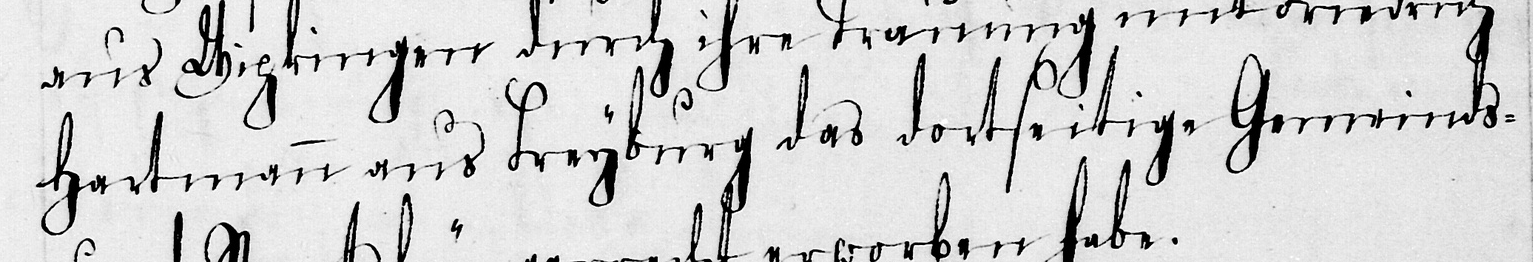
Hartmann aus Freyburg das dortseitige Gemeinds-
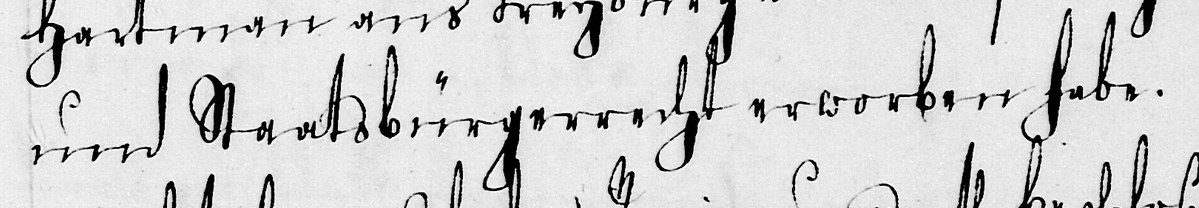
und Staatsbürgerrecht erworben habe.
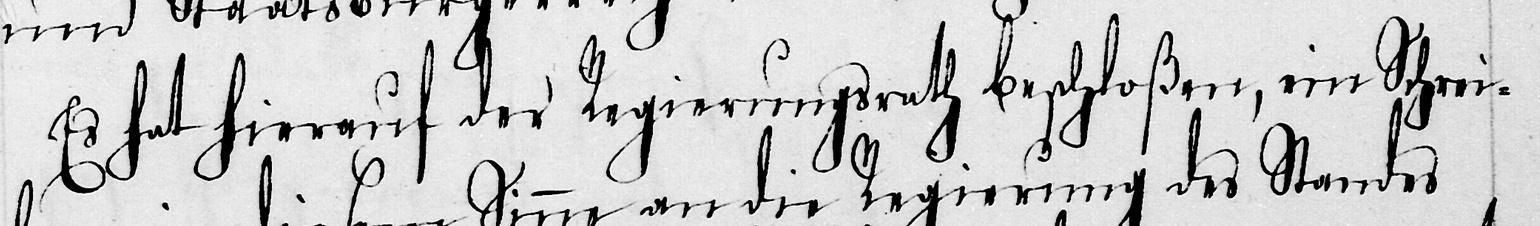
Es hat hierauf der Regierungsrath beschloßen, ein Schre¬
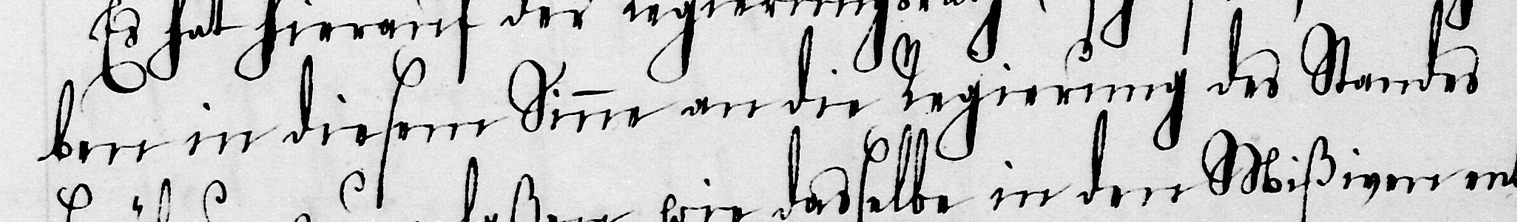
iben in diesem Sinne an die Regierung des Standes
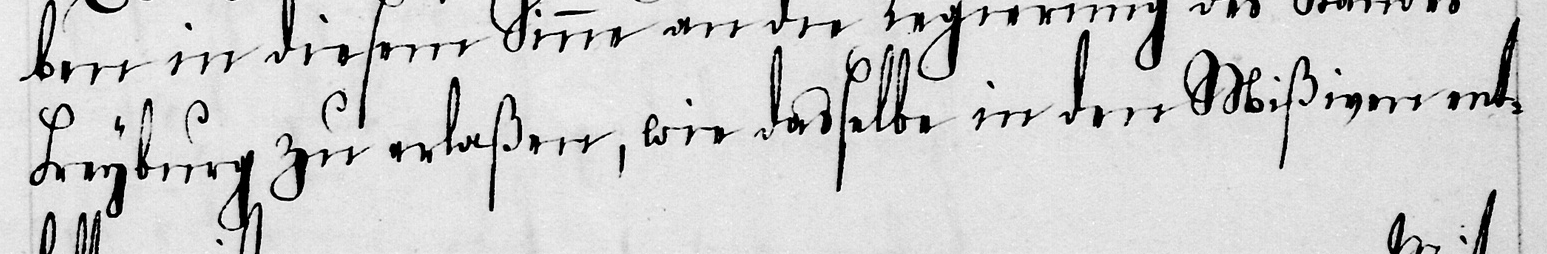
Freyburg zu erlaßen, wie dasselbe in den Mißiven ent¬
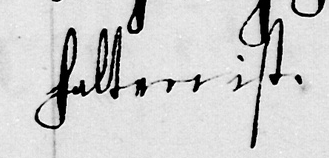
halten ist.
